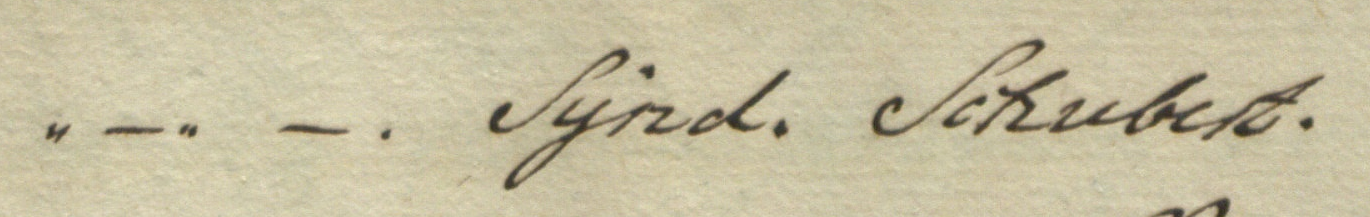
Sÿnd. Schubert.
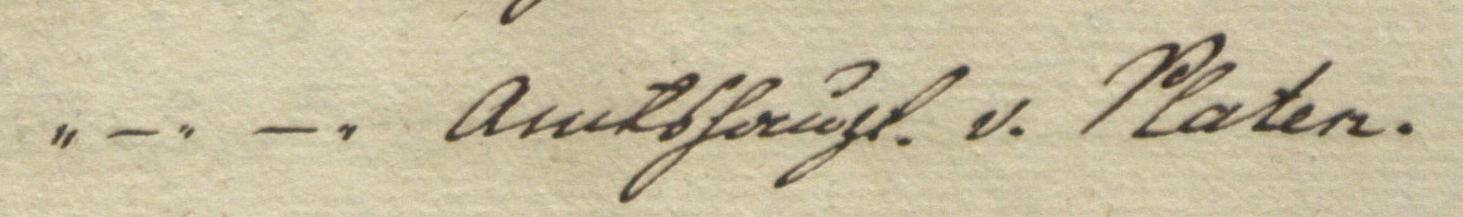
Amtshaupt. v. Platen.
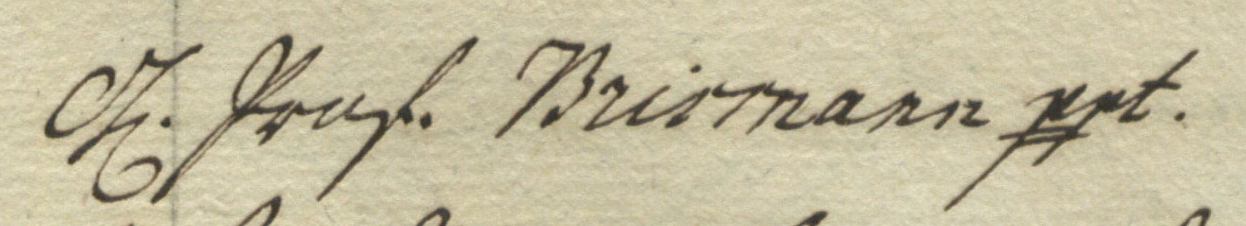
dh. Prof. Brismann ppt.
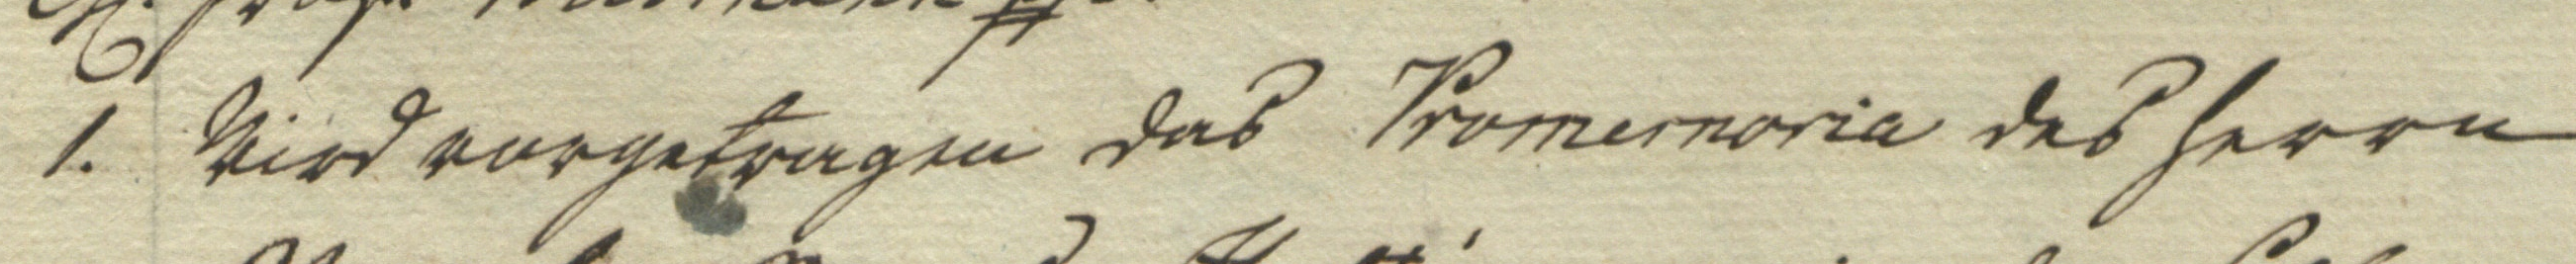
1. Wird vorgetragen das Promemoria des Herrn
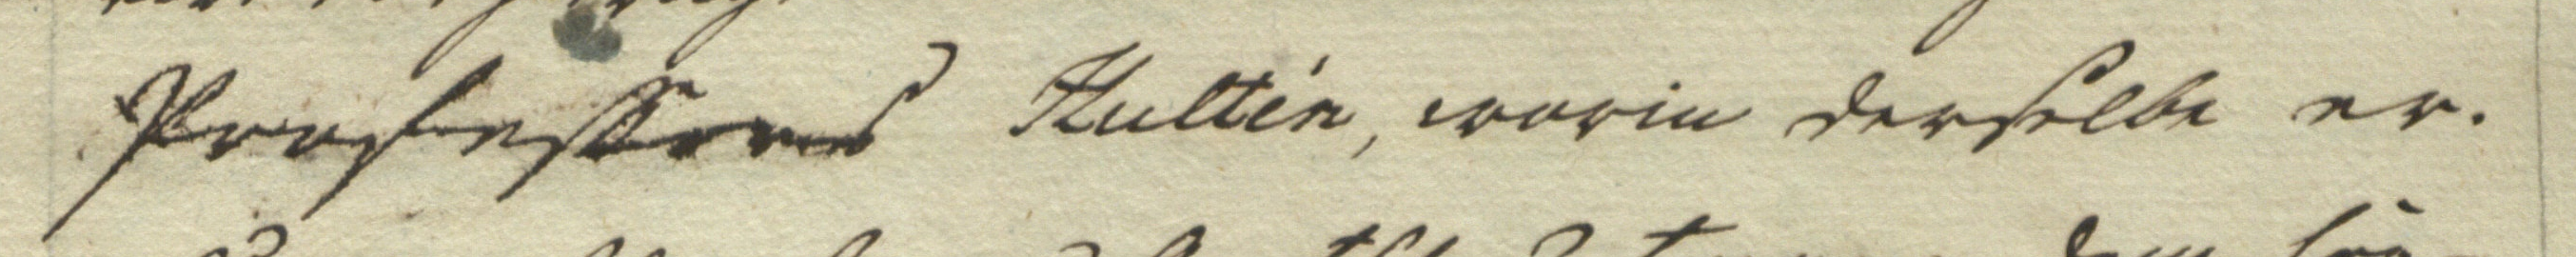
Professors Hultén worin derselbe er
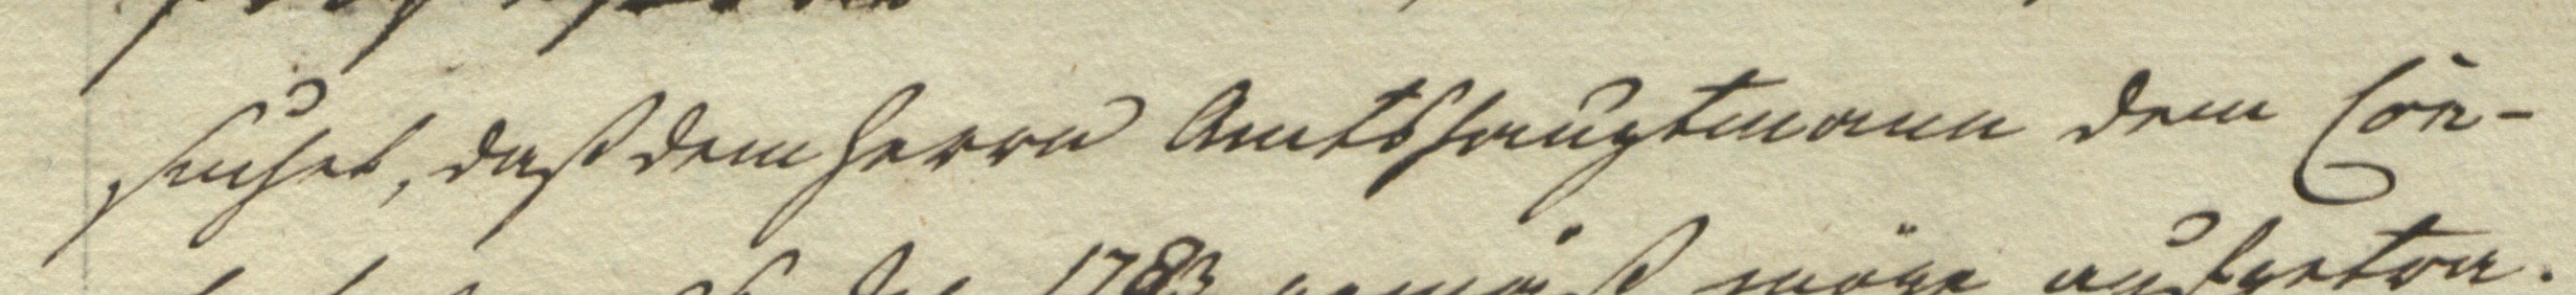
suchet, daß dem Herrn Amtshauptmann dem Con¬
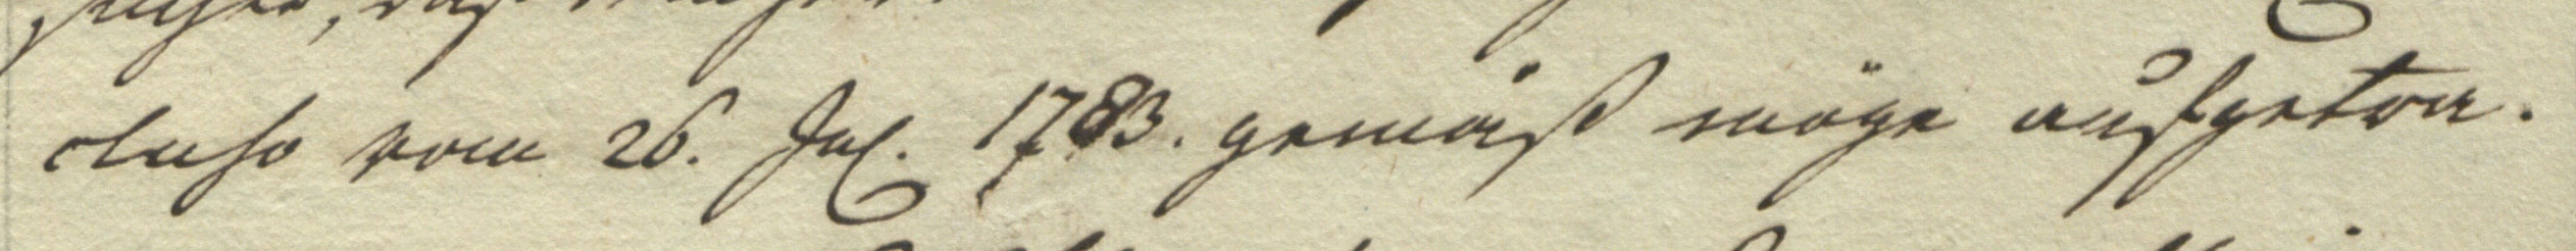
cluso vom 26. Jul. 1793. gemäß möge aufgetra¬
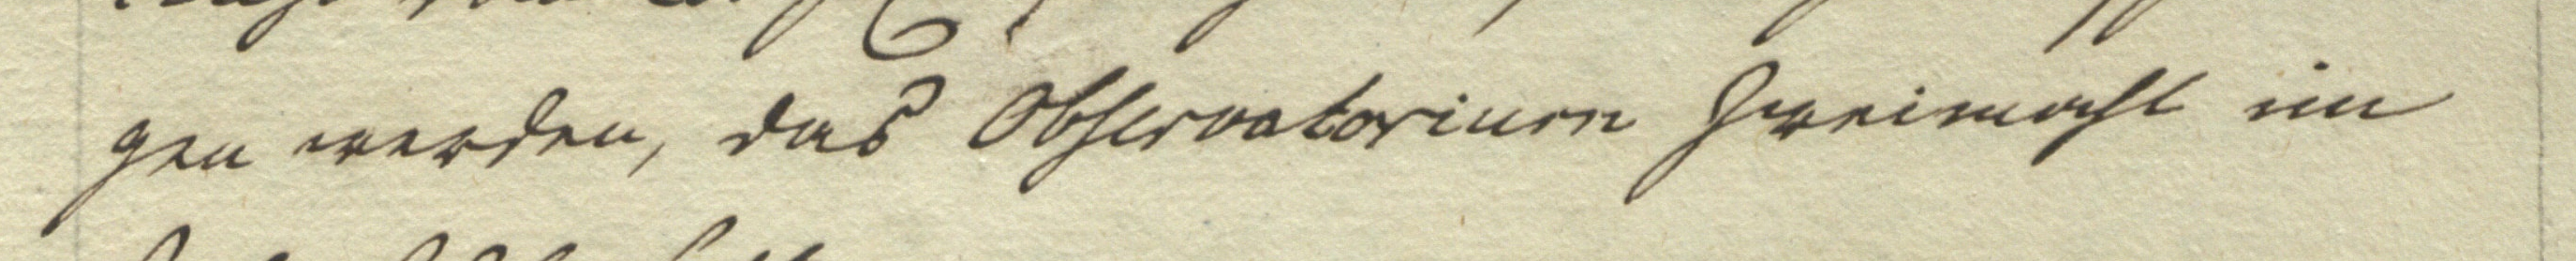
gen werden, das Obserovatorium Zweimahl im
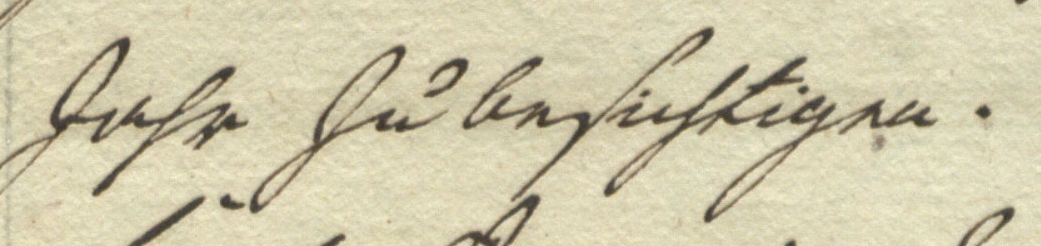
Jahr zu besichtigen.
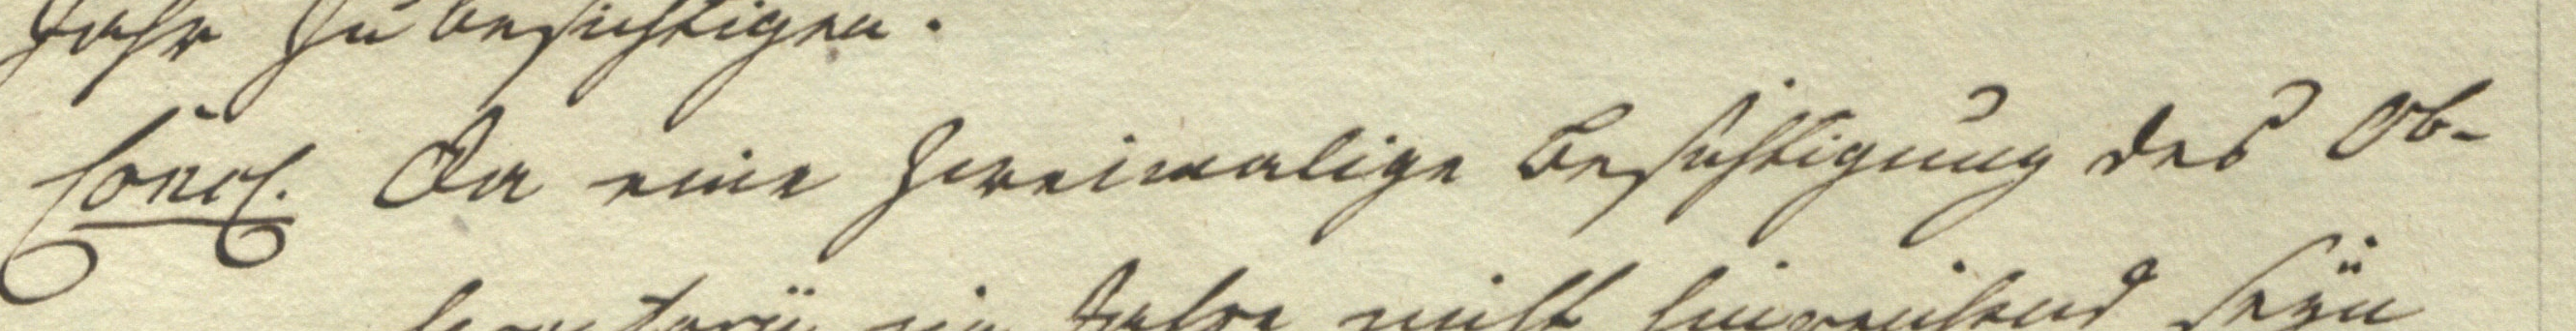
Concl. Da eine zweimalige Besichtigung des Ob¬
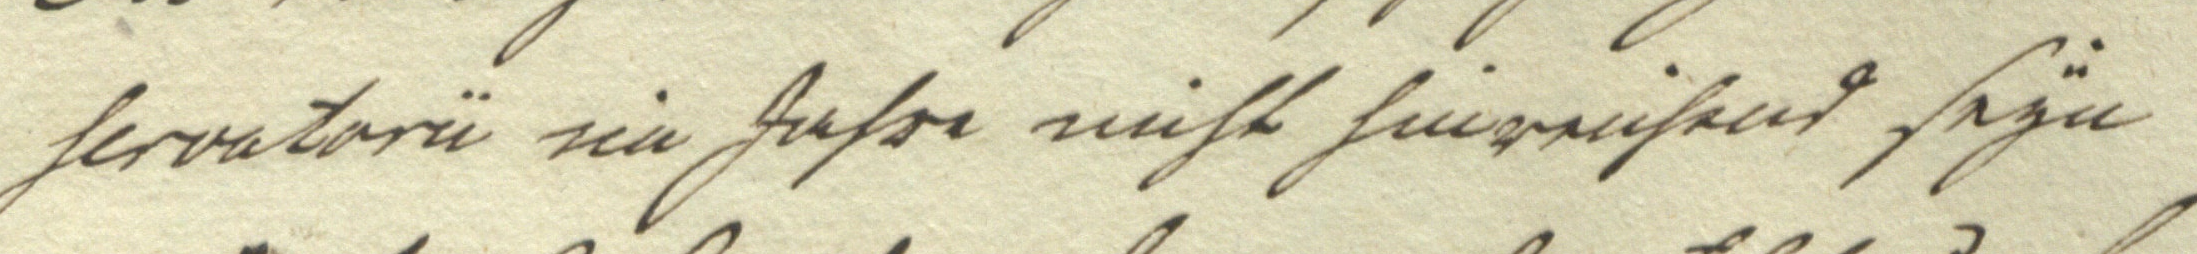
servatorii im Jahre nicht hinreichend seÿn
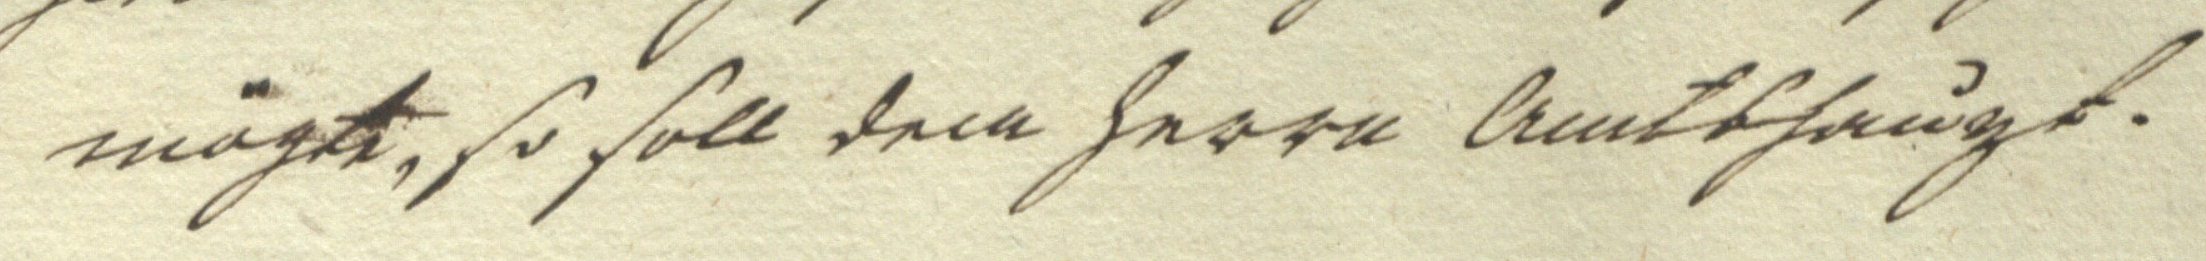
mögte, so soll dem Herrn Amtshaupt¬
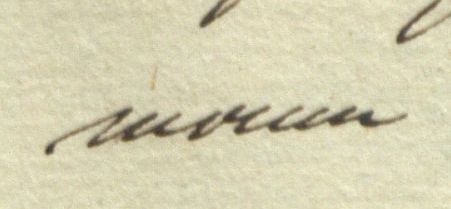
mann
